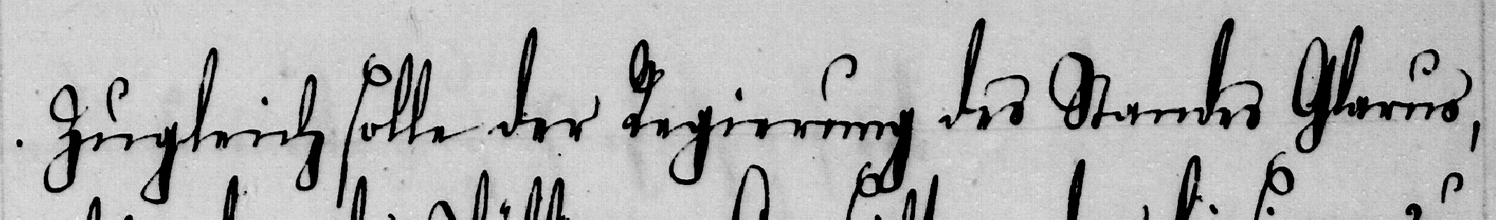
Zugleich solle der Regierung des Standes Glarus,
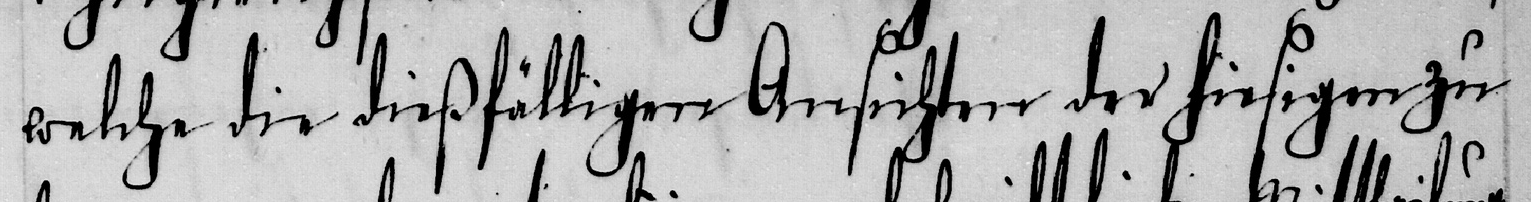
welche die dießfälligen Ansichten der hiesigen zu
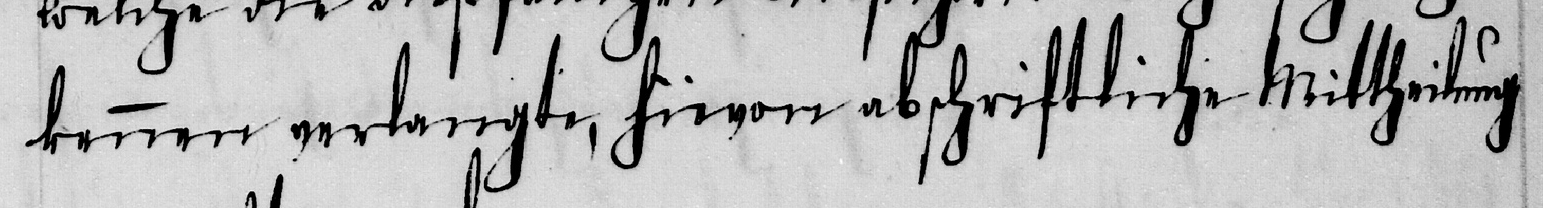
kennen verlangte, hievon abschriftlich Mittheilung
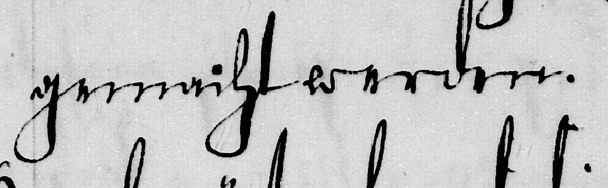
gemacht zu werden.
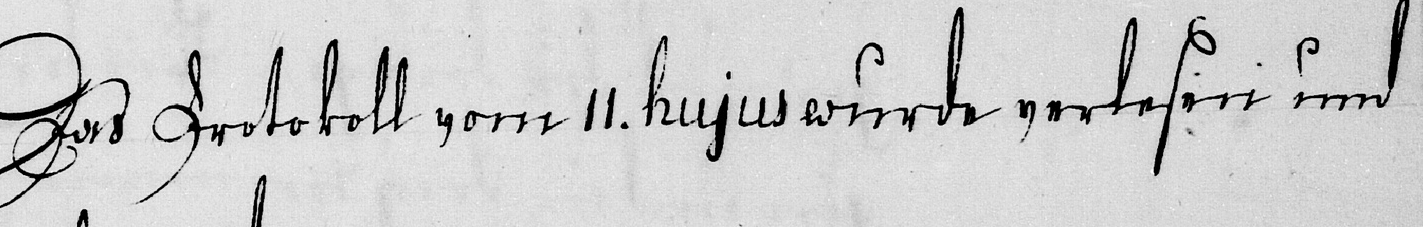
Das Protokoll vom 11. hujus wurde verlesen und
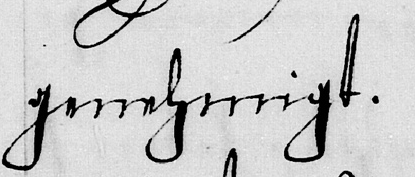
genehmigt.
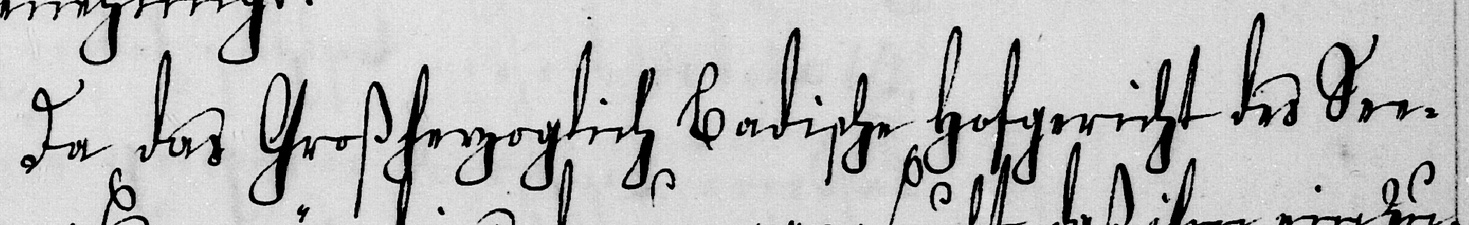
Da das Großherzoglich Badische Hofgericht des Se¬
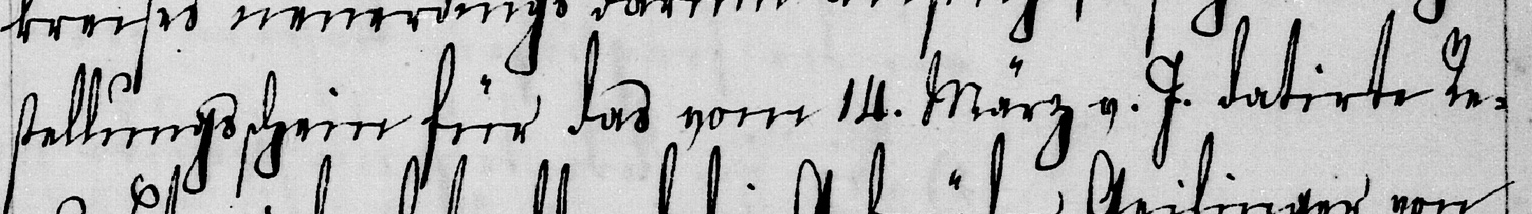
tellungsschein für das vom 14. März v. J. datirte Re¬
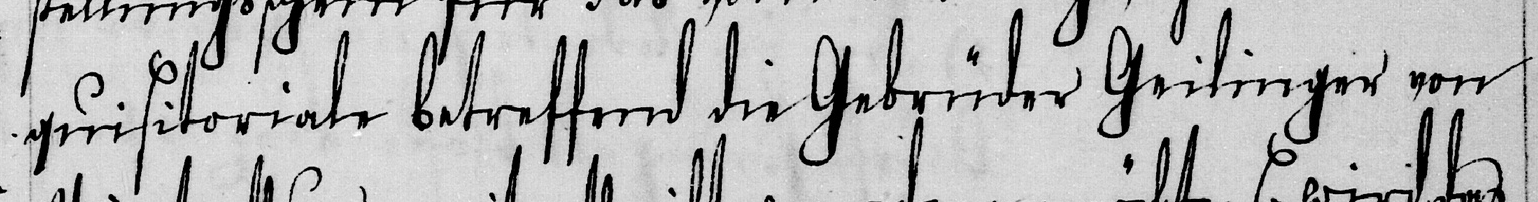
quisitoriale betreffend die Gebrüder Geilinger von
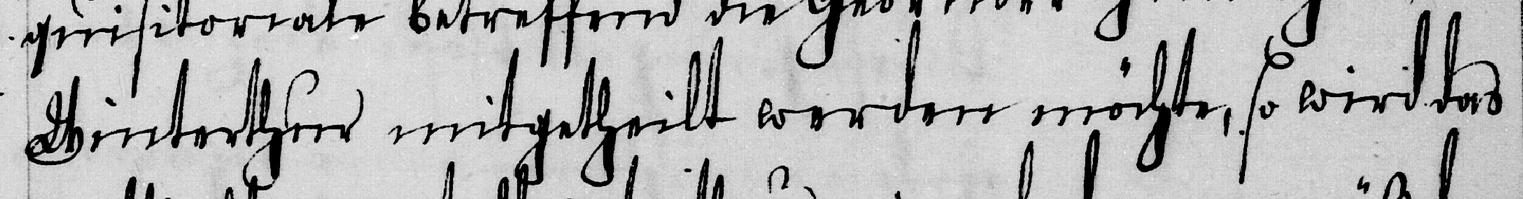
Winterthur mitgetheilt werden möchte, so wird das
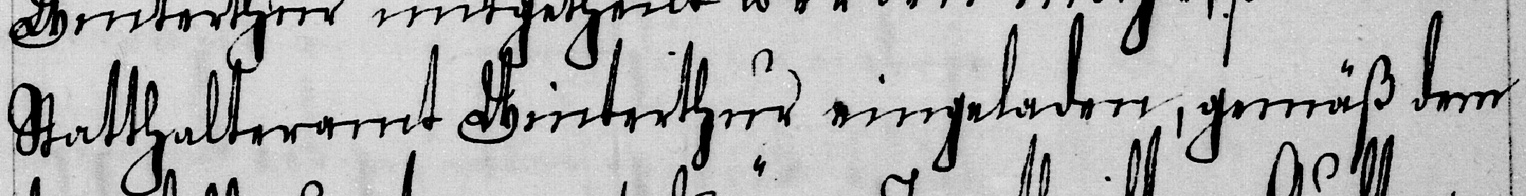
Statthalteramt Winterthur eingeladen, gemäß dem
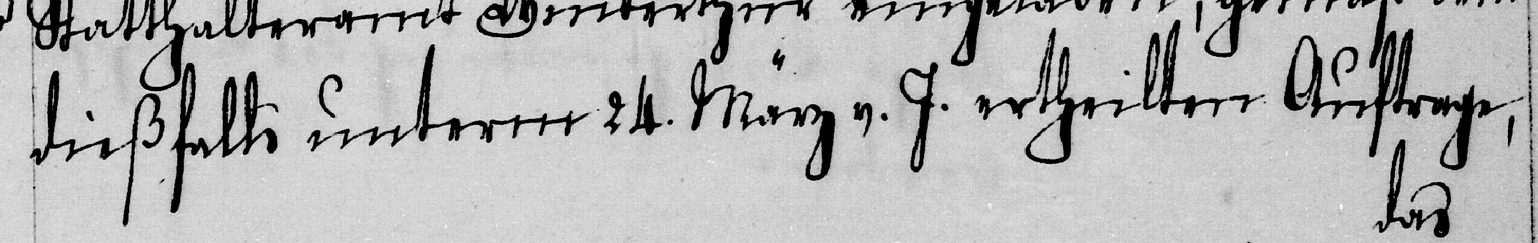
dießfalls unterm 24. März v. J. ertheilten Auftrage,
